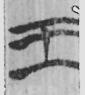王
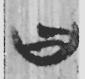曰
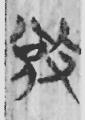敓（說）
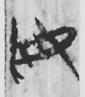母
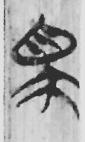蜀
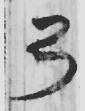乃
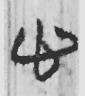心
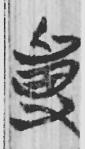尃
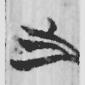之
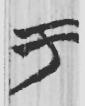于
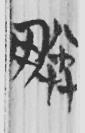朕
